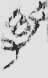幼
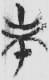未
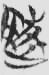陞
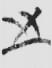之
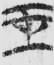玉
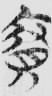○（府）
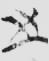之
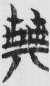典
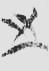之
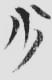少
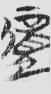僮
